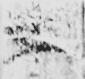東
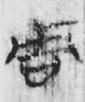周
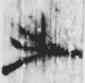之
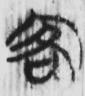客
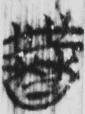○（許）
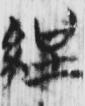○（盈）
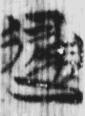歸
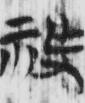祚（胙）
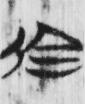於
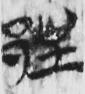郢
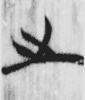之
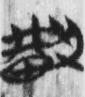○（荆）
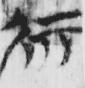𫵖
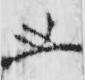之
